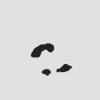㠯（以）
